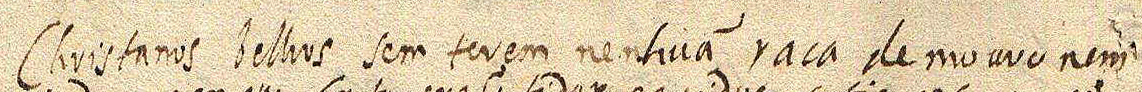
Christanos velhos sem terem nenhuā raca de mouro nem
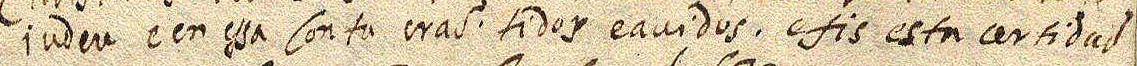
iudeu e en essa Conta eraõ tidos e auidos. e fis esta certidaõ
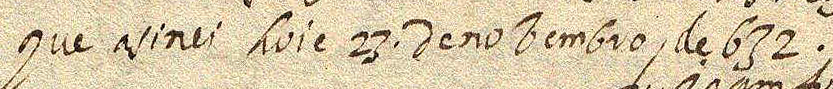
que asinei hoie 23. de novembro de 632.
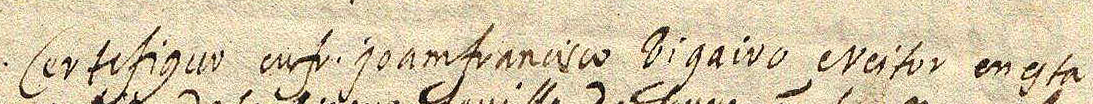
Certefiquo eu fr. joam francisco vigairo e reitor en esta
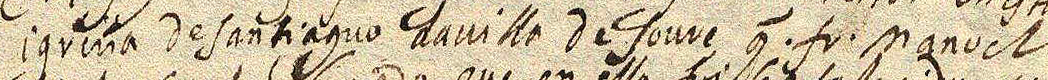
igreiia de Santiaguo da uilla de Soure, q̄. fr. Manuel
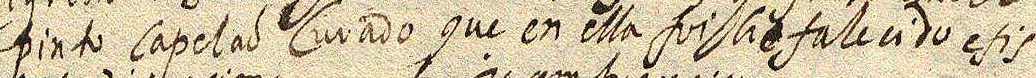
pinto capelaõ Curado que en ella foi he falecido e fis
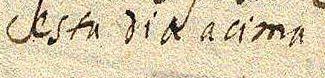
esta dia acima
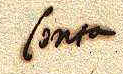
Conta
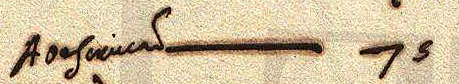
Ao escriuaõ - 75
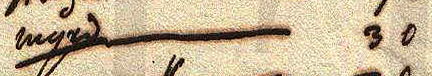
inqro - 30
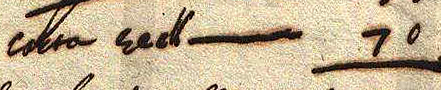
carta Et all - 70
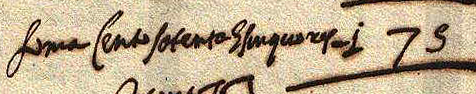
soma Cento setemta E sinquo res - i75
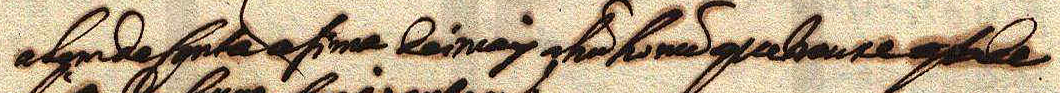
alem da Conta asima dei mais a hū homē que trouxe _ de
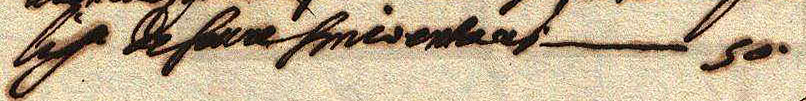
iga de soure sincoenta rs̄ - 50.
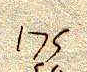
175
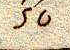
50
